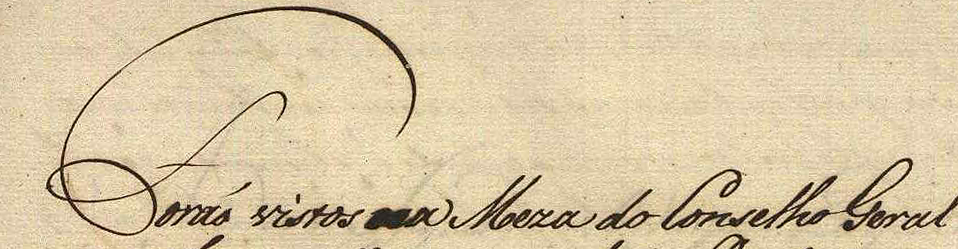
Foraõ vistos na Meza do Conselho Geral
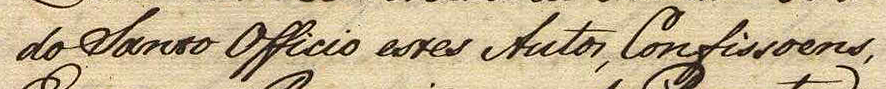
do Santo Officio estes Autos, Confissoens,
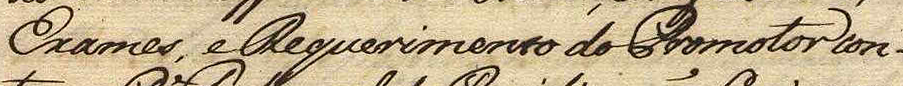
Exames, e Requerimento do Promotor con
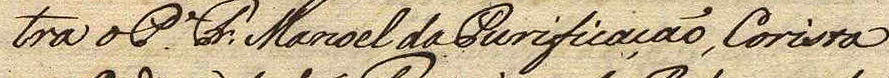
tra o P.e Fr. Manoel da Purificaçaõ, Corista
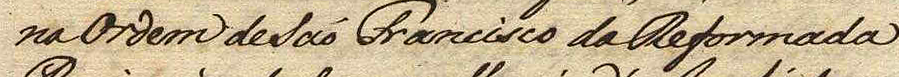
na Ordem de Saõ Francisco da Reformada
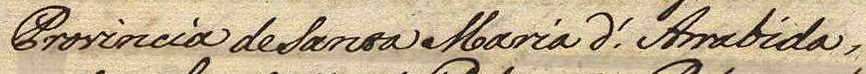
Provincia de Santa Maria d'Arrabida,
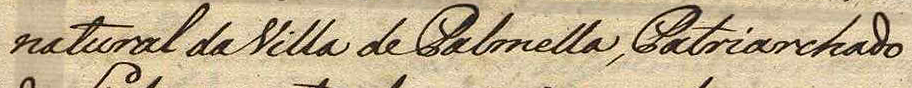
natural da Villa de Palmella, Patriarchado
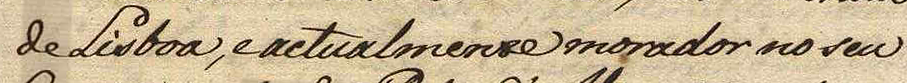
de Lisboa, e actualmente morador no seu
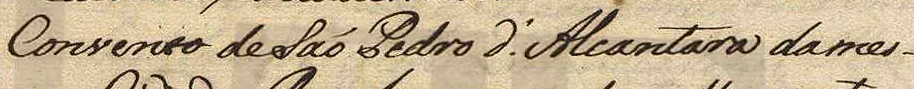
Convento de Saõ Pedro d'Alcantara da mes
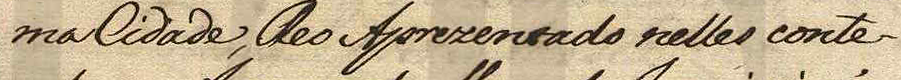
ma Cidade, Reo Aprezentado nelles conte
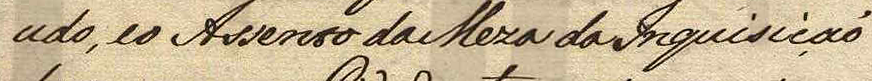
udo, e o Assento da Meza da Inquisiçaõ
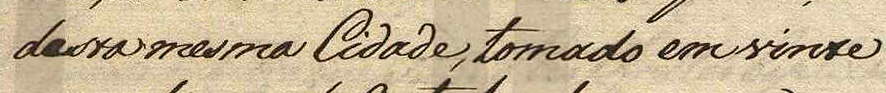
desta mesma Cidade, tomado em vinte
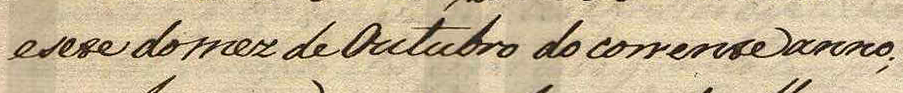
e sete do mez de Outubro do corrente anno;
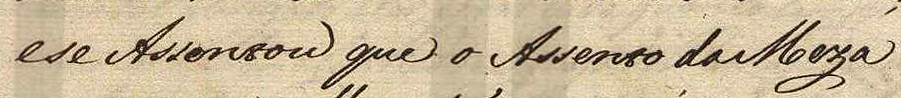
e se Assentou que o Assento da Meza
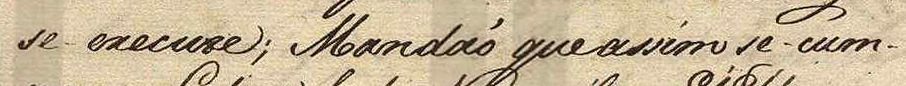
se execute; Mandaõ que assim se cum
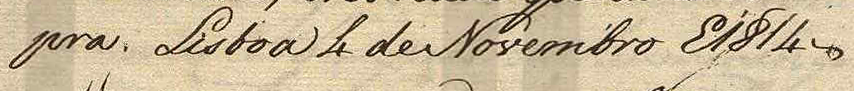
pra. Lisboa 4 de Novembro d̄ i814
